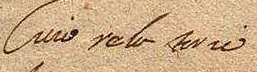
Cuio relatorio
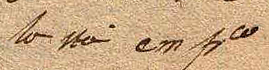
la sta em fr.co
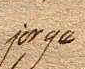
jorge
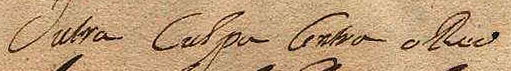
Outra Culpa Contra o Reo
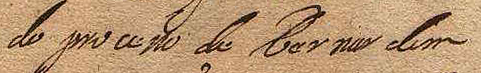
do processo de Bernardim
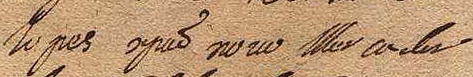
lopes xpaõ nouo Mercador
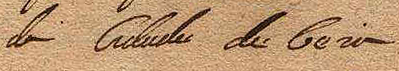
da Cidade de beia
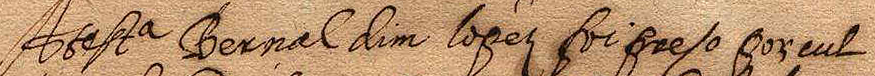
A testa Bernaldim lopēz foi preso por cul
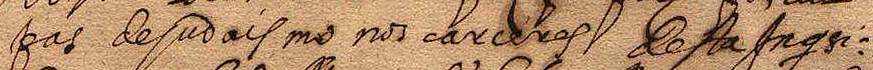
pas de judaismo nos carceres desta jnꝗsi
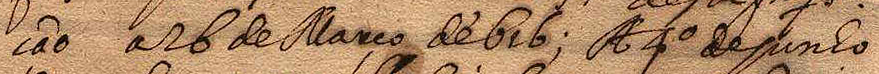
ção a 16 de Março de 616; A 4o de junho
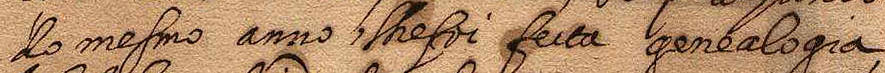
do mesmo anno, lhe foi feita genealogia
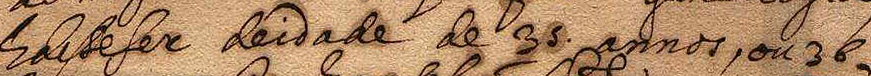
E disse ser de idade de 35 annos, ou 36
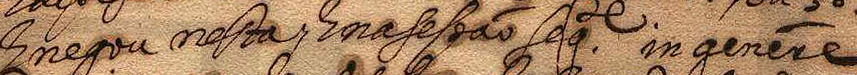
E negou nesta E na sessão seg.te in genere
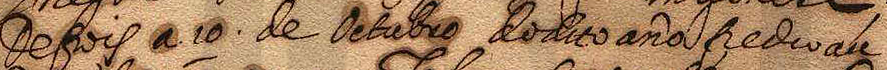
depois a 10 de Octubro do dito an̄o pedio au
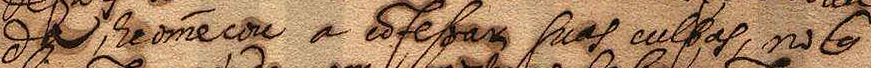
da, E começou a cōfessar suas culpas, no q̄
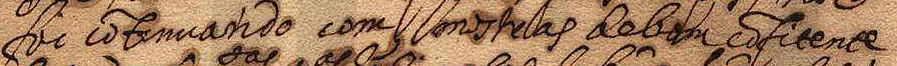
foi cōtinuando com mostras de bom cōfitente
